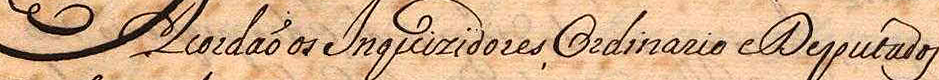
Acordaõ os Inquizidores, Ordinario e Deputados
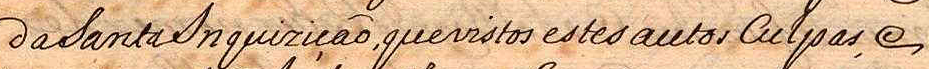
da Santa Inquiziçaõ, que vistos estes autos Culpas, e
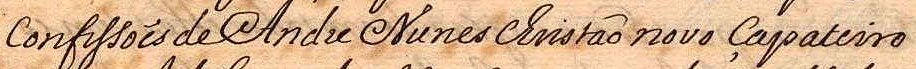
Confissoẽs de Andre Nunes Christaõ novo Çapateiro
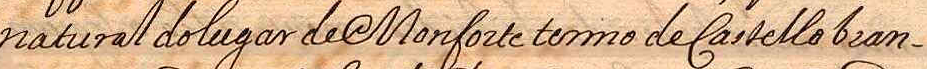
natural do Lugar de Monforte termo de Castello bran
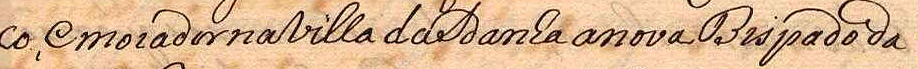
co, e morador na Villa da Idanha a nova Bispado da
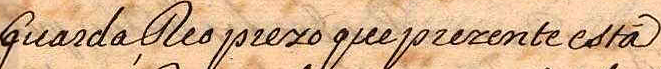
Guarda, Reo prezo que prezente está
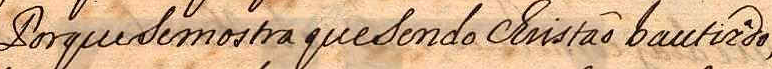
Porque Se mostra que Sendo christaõ bautizado,
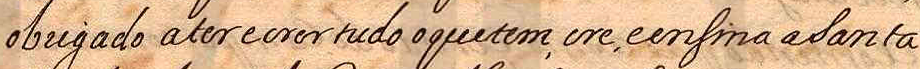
obrigado a ter e crer tudo o que tem, cre e ensina a Santa
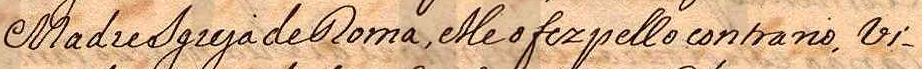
Madre Igreja de Roma, elle o fez pello contrario, vi
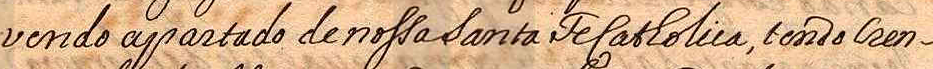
vendo apartado de nossa Santa Fe Catholica, tendo cren
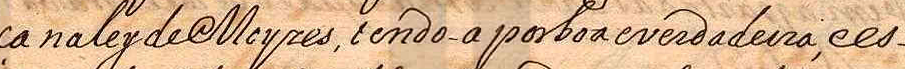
ça na ley de Moyzes, tendo-a por boa e verdadeira, e es
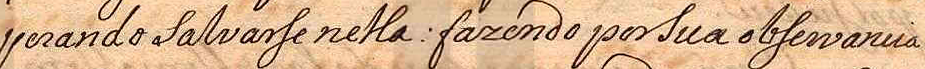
perando salvarse nella: fazendo por sua observancia
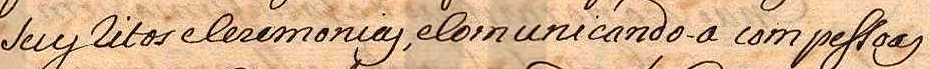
seus Ritos e Ceremonias, e Comunicando-a com pessoas
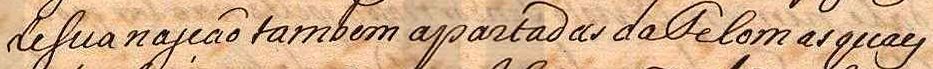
de sua nasção tambem apartadas da Fe Com as quaes
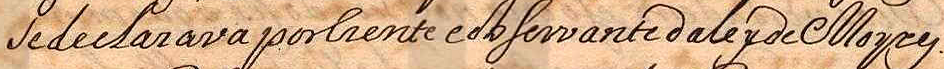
se declarava por Crente e observante da ley de Moyzes.
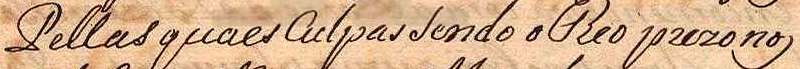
Pellas quaes Culpas sendo o Reo prezo nos
